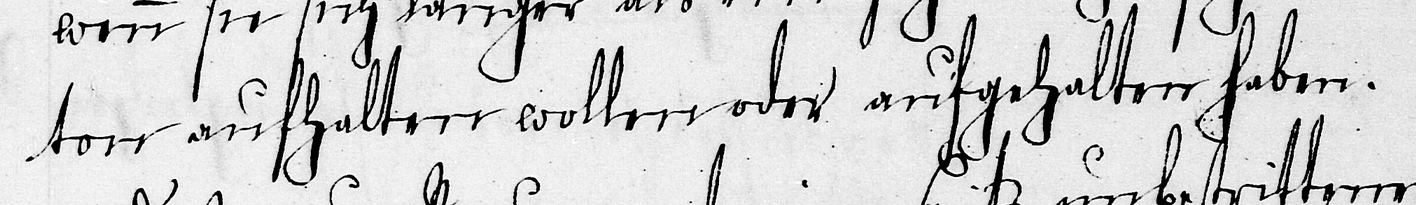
ton aufhalten wollen oder aufgehalten haben.
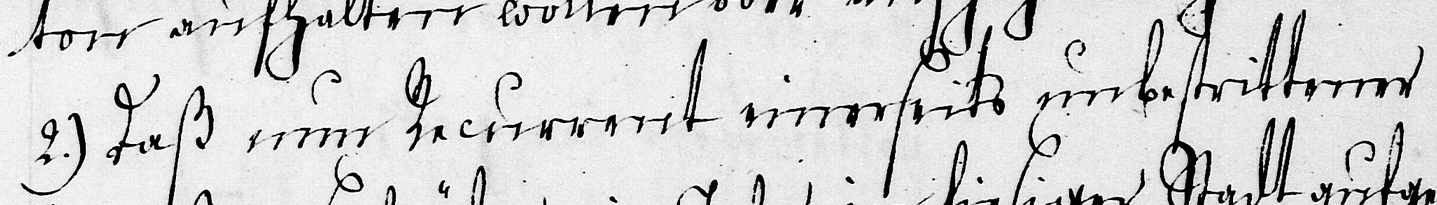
2.) Daß nun Recurrent einerseits unbestrittener
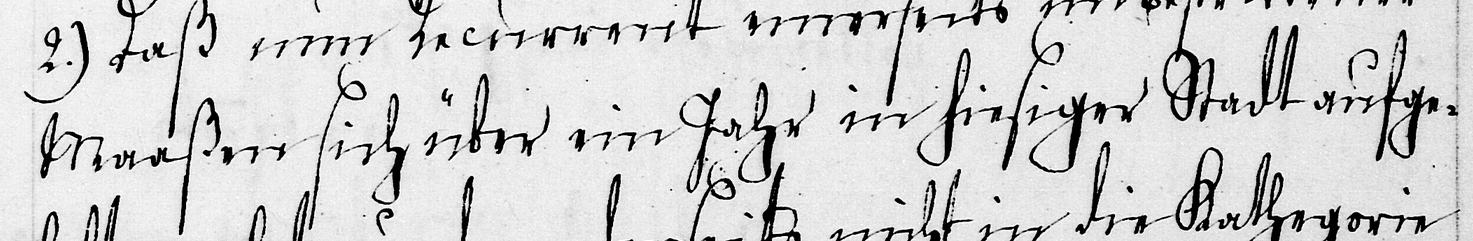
Maaßen sich über ein Jahr in hiesiger Stadt aufge¬
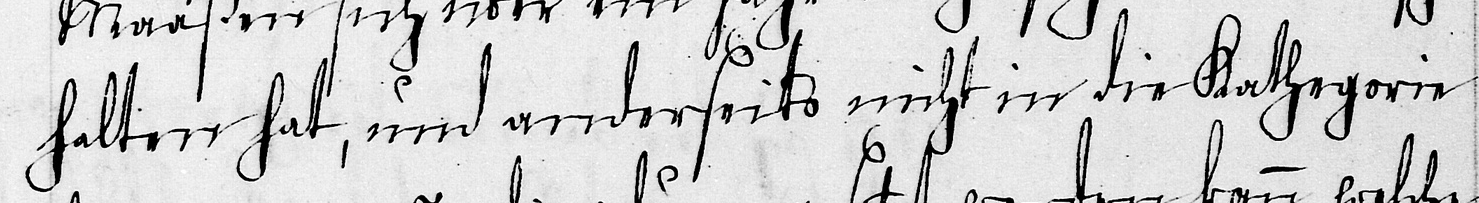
halten hat, und anderseits nicht in die Kathegorie
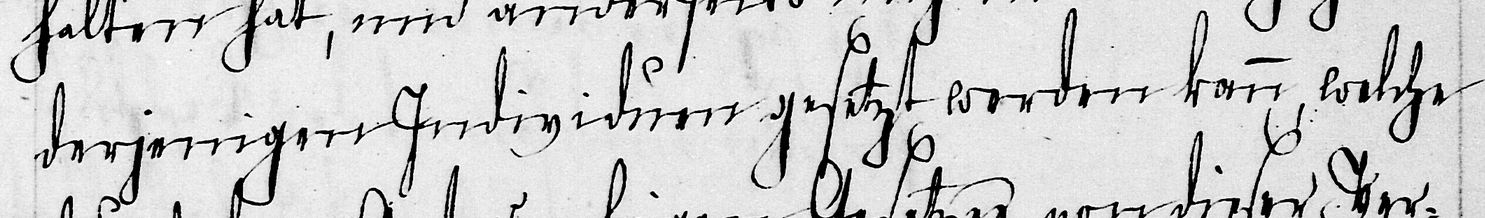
derjenigen Individuen gesetzt werden kann, welche
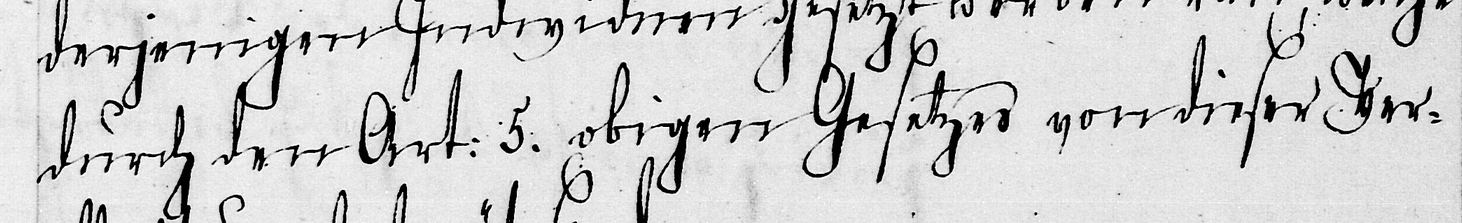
durch den Art: 5. obigen Gesetzes von dieser Ver¬
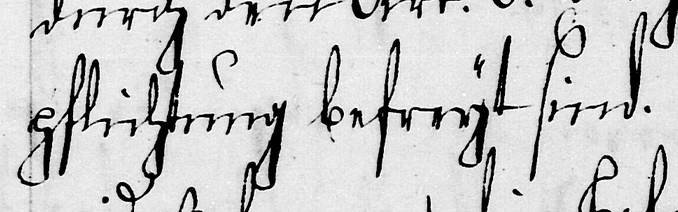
lichtung befreyt sin¬
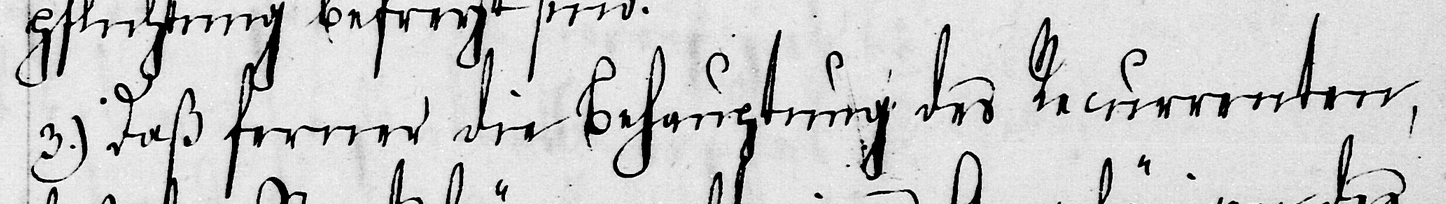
3.) Daß ferner die Behauptung des Recurrenten,
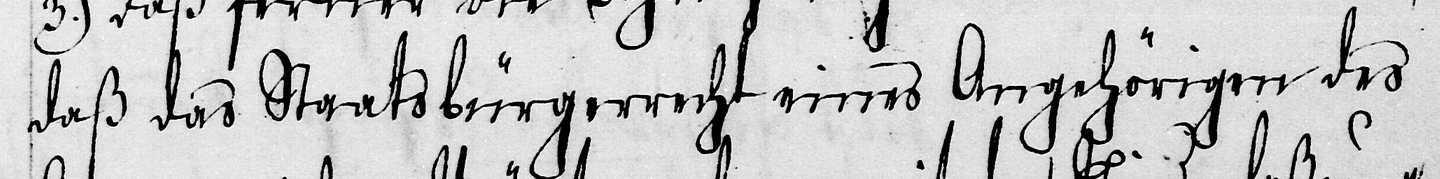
daß das Staatsbürgerrecht eines Angehörigen des
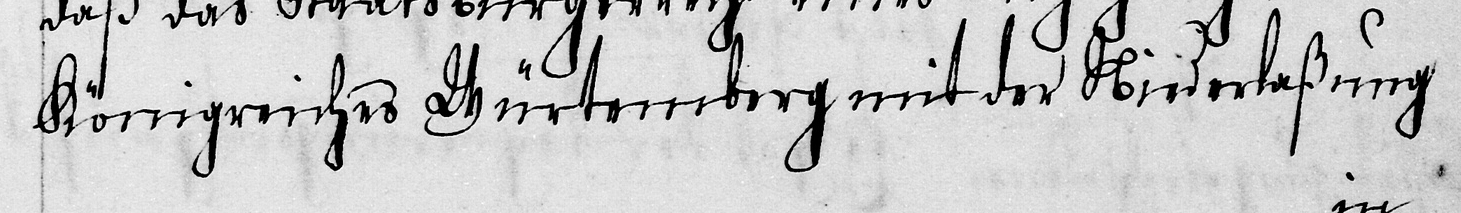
Königreiches Würtemberg mit der Niederlaßung
